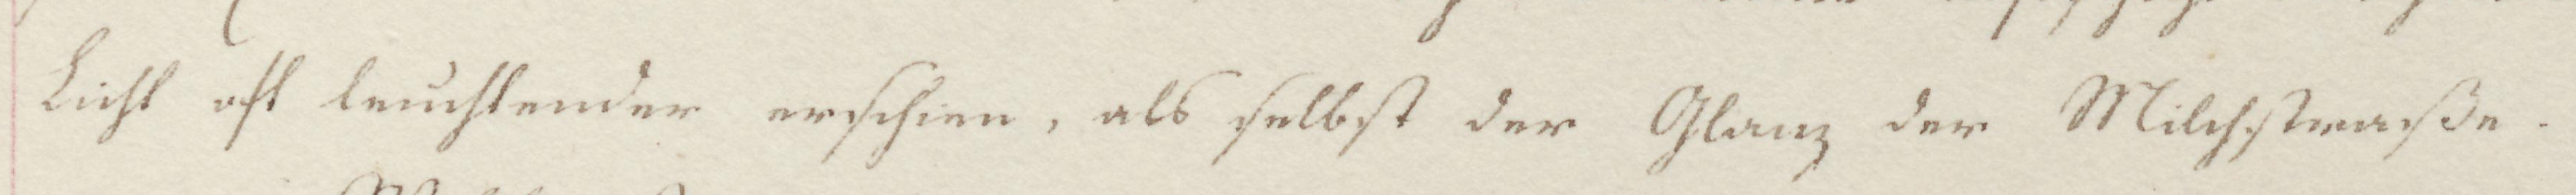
Licht oft leuchtender erschien, als selbst der Glanz der Milchstraße.
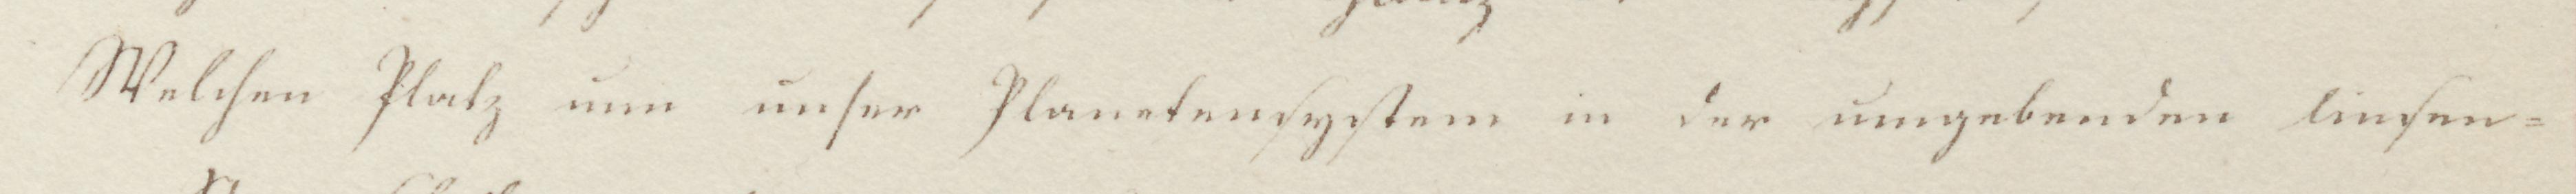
Welchen Platz nun unser Planetensystem in der umgebenden linsen-
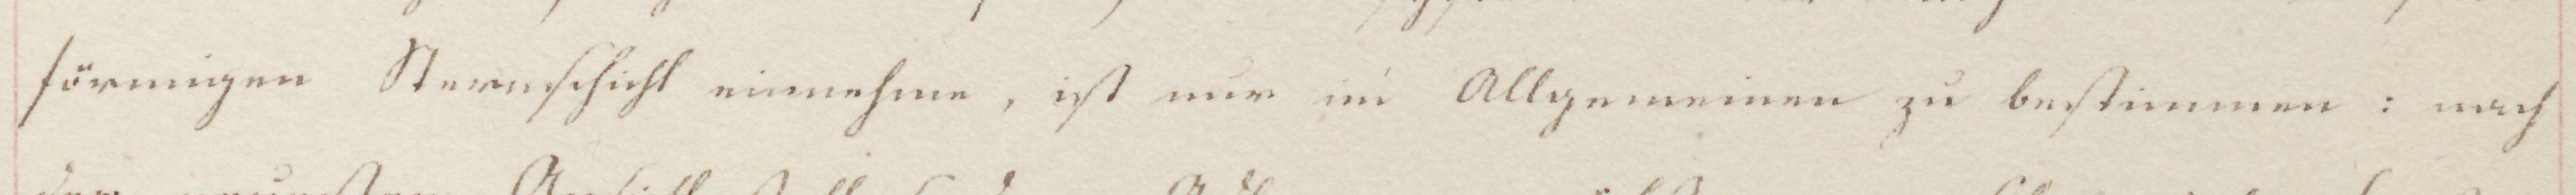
förmigen Sternschicht einnehme, ist nur im Allgemeinen zu bestimmen: nach
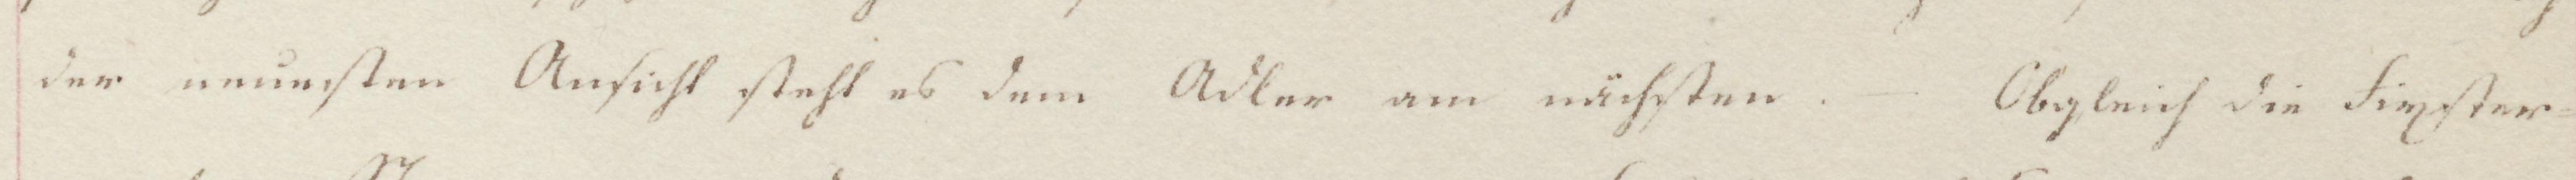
der neuesten Ansicht steht es dem Adler am nächsten. Obgleich die Fixster-
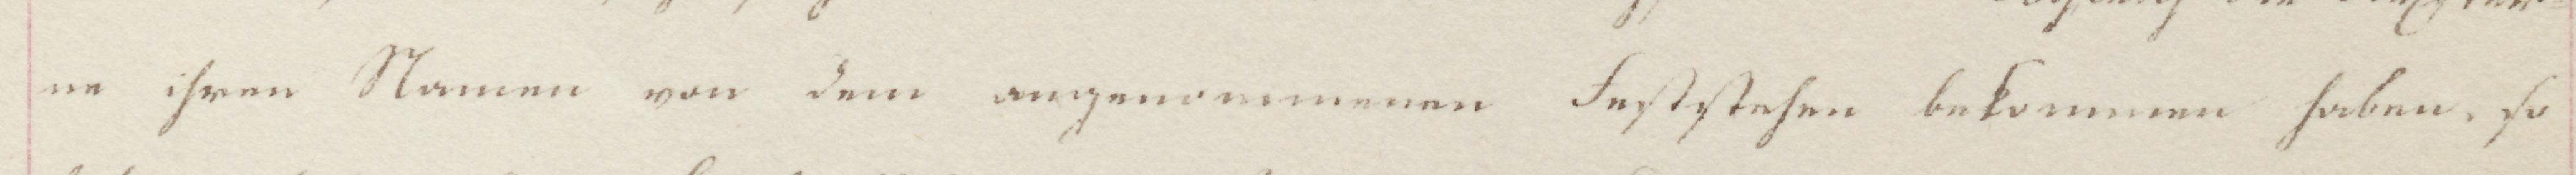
ne ihren Namen von dem angenommenen Feststehen bekommen haben, so
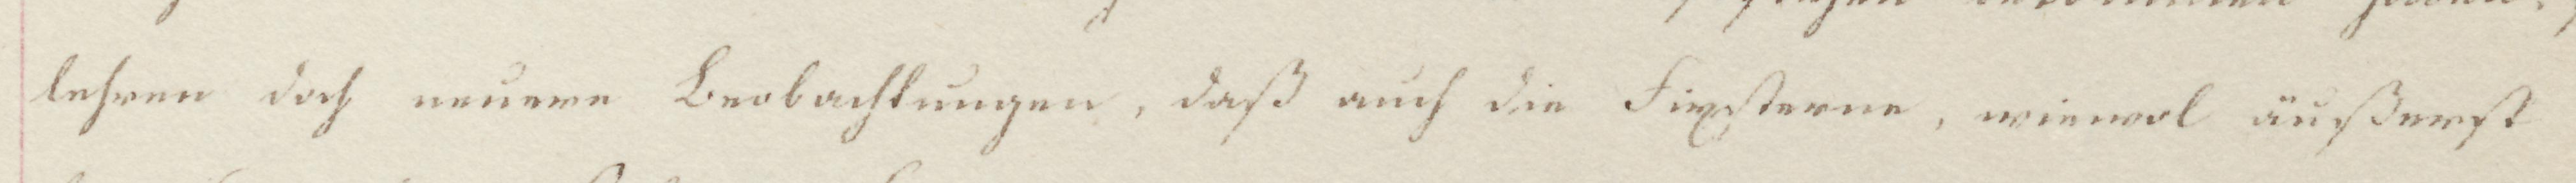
lehren doch neuere Beobachtungen, daß auch die Fixsterne, wiewol äußerst
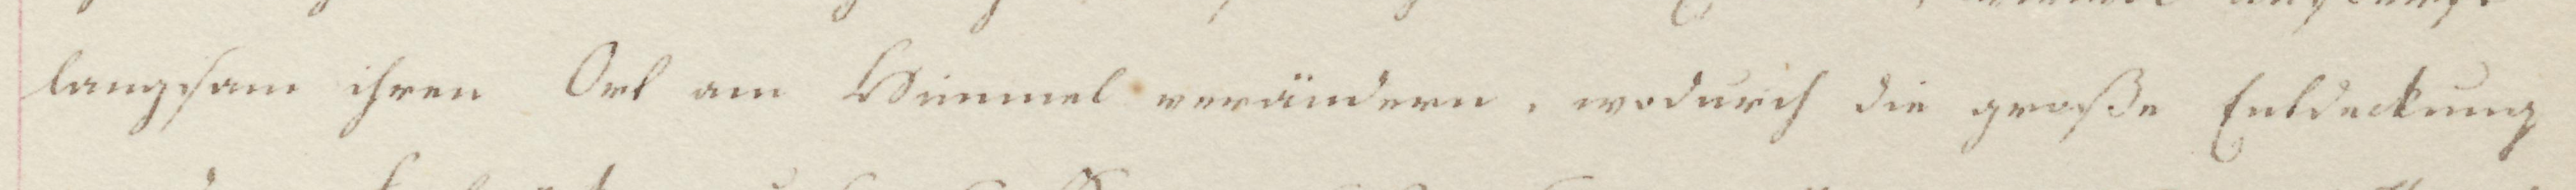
langsam ihren Ort am Himmel verändern, wodurch die große Entdeckung
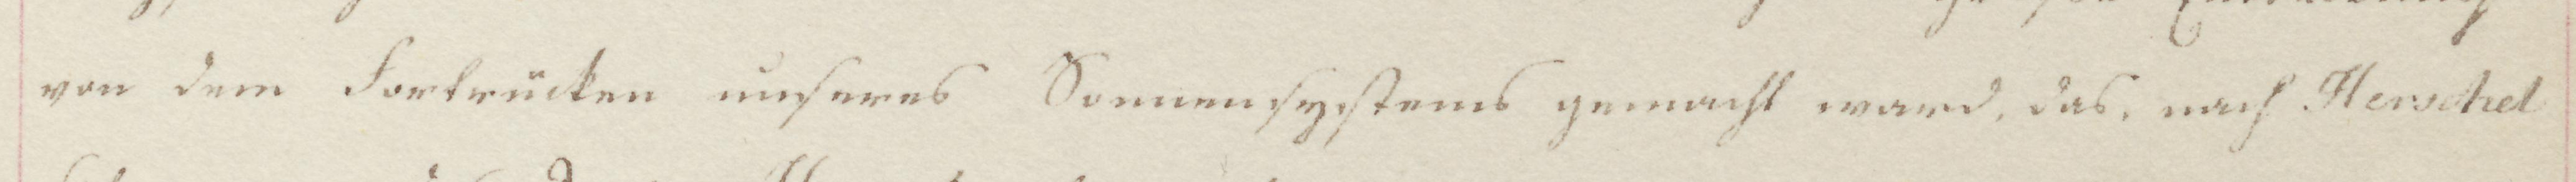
von dem Fortrücken unseres Sonnensystems gemacht ward, das, nach Herschel
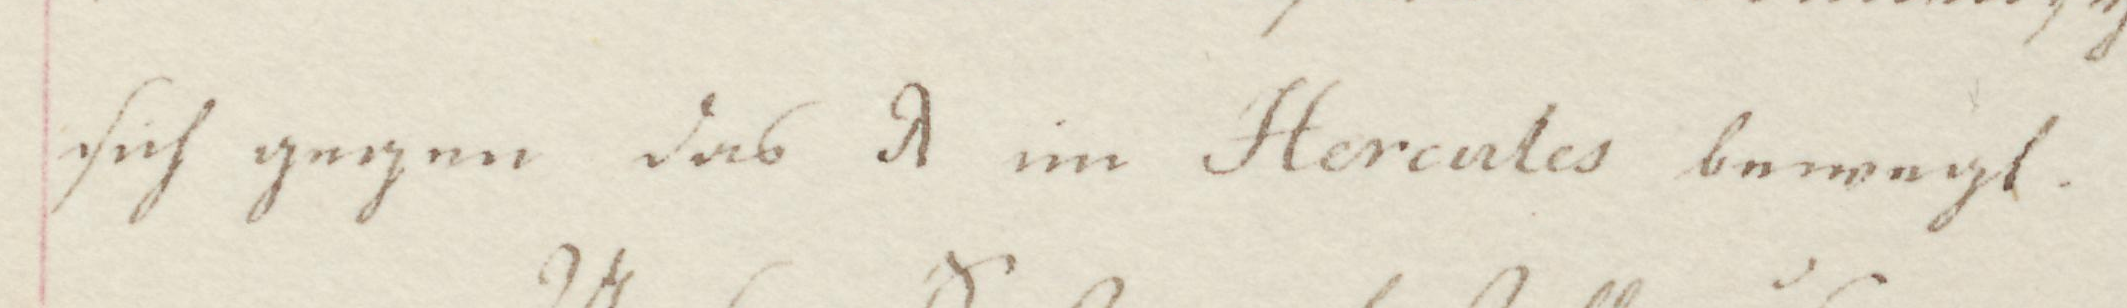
sich gegen das λ im Hercules bewegt.
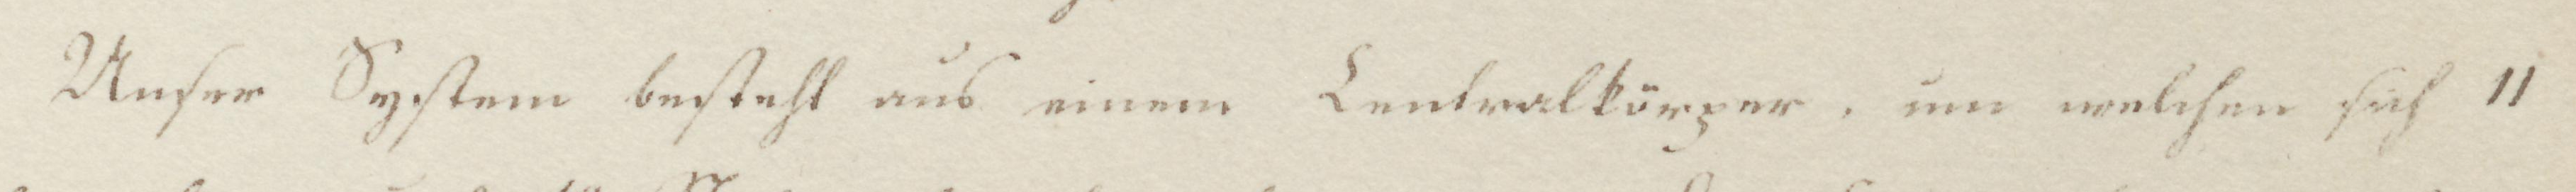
Unser System besteht aus einem Centralkörper, um welchen sich 11
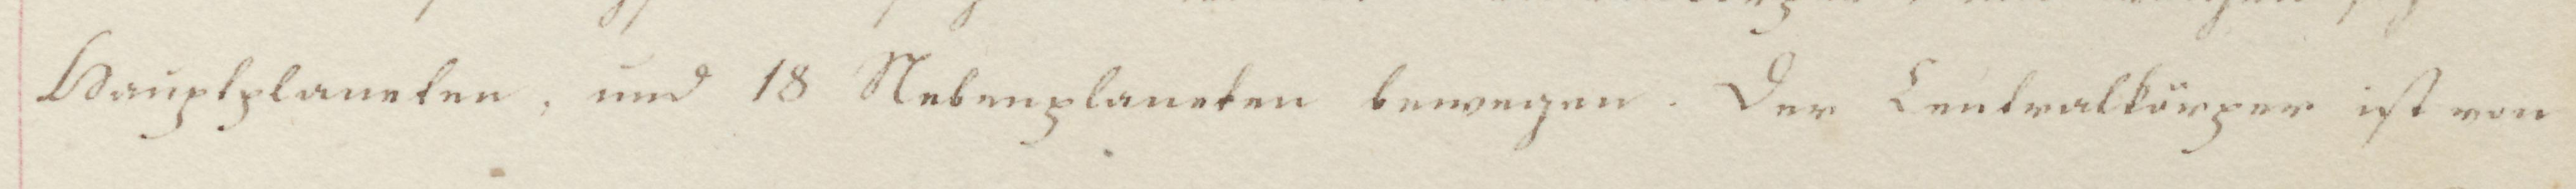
Hauptplaneten und 18 Nebenplaneten bewegen. Der Centralkörper ist von
